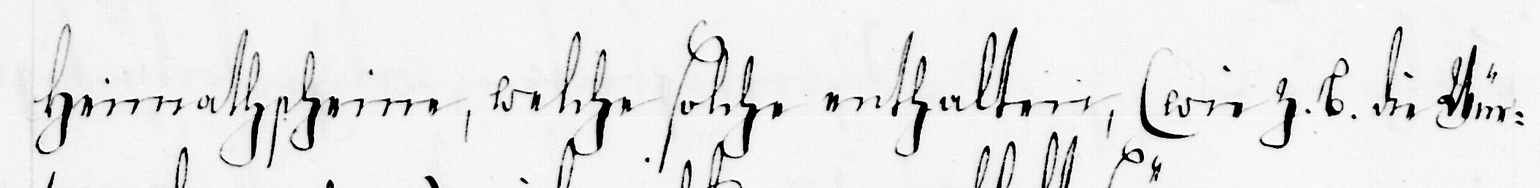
Heimathscheine, welche solche enthalten, (wie z. B. die Wür¬
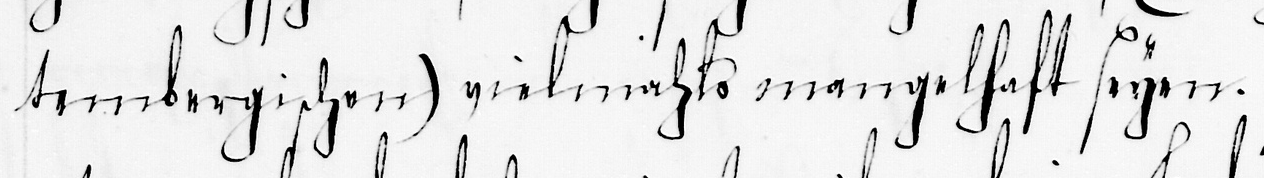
tembergischen) vielmahls mangelhaft seyen.
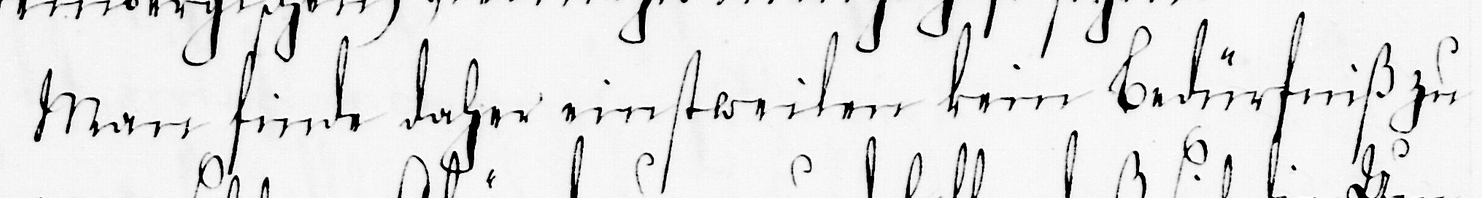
Man finde daher einstweilen kein Bedürfniß zu
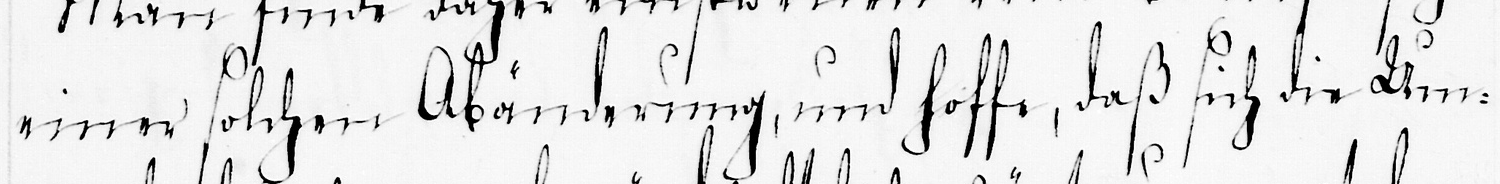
einer solchen Abänderung, und hoffe, daß sich die Um¬
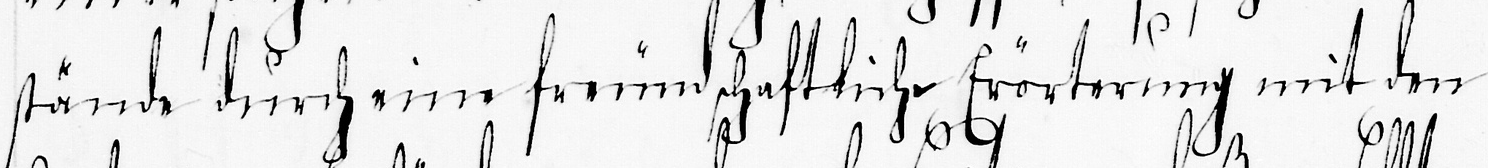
stände durch eine freundschaftliche Erörterung mit den
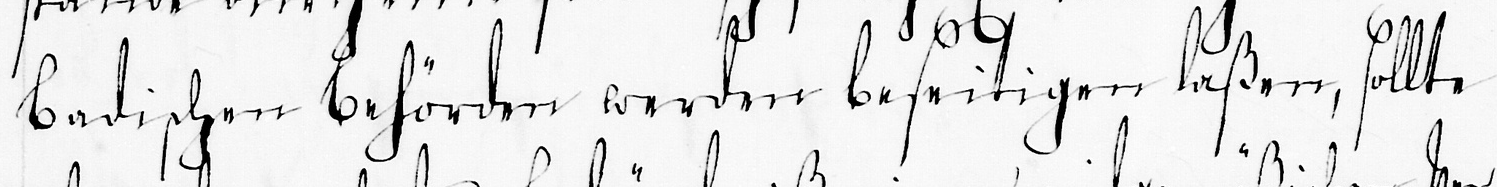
badischen Behörden werden beseitigen laßen, sollte
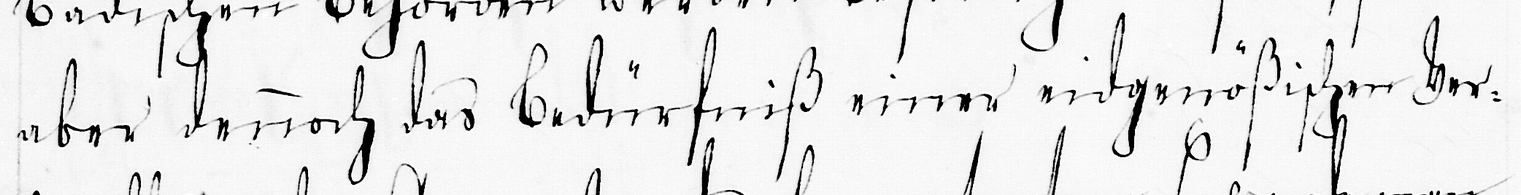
aber dennoch das Bedürfniß einer eidgenößischen Ver¬
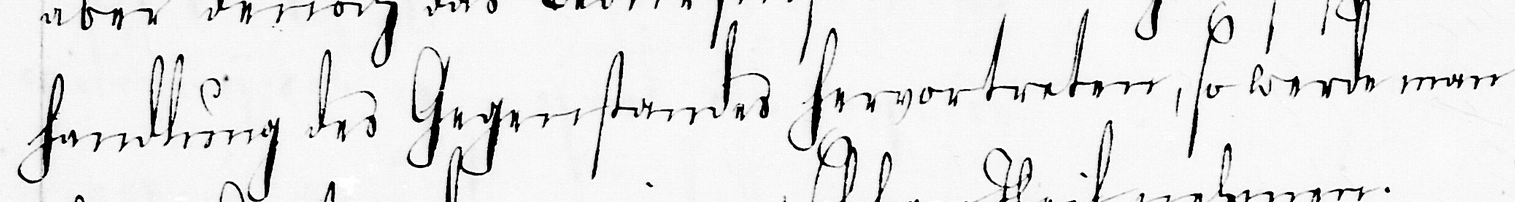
handlung des Gegenstandes hervortreten, so werde man
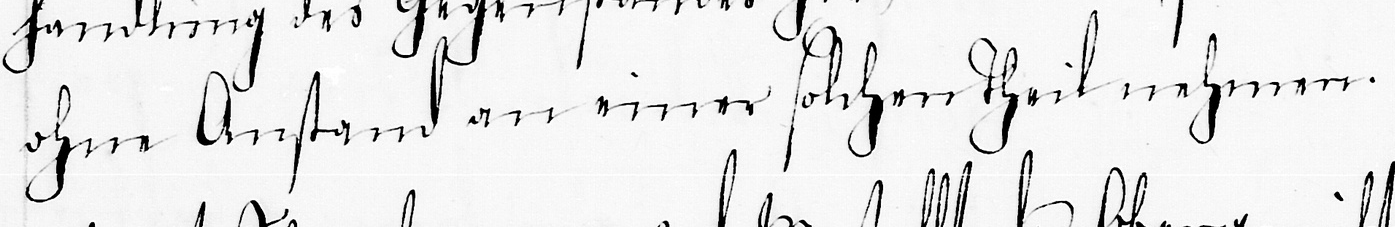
ohne Anstand an einer solchen Theil nehmen.
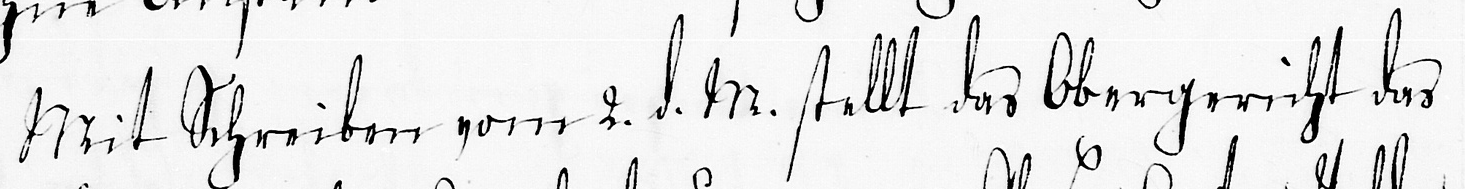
Mit Schreiben vom 2. d. M. stellt das Obergericht das
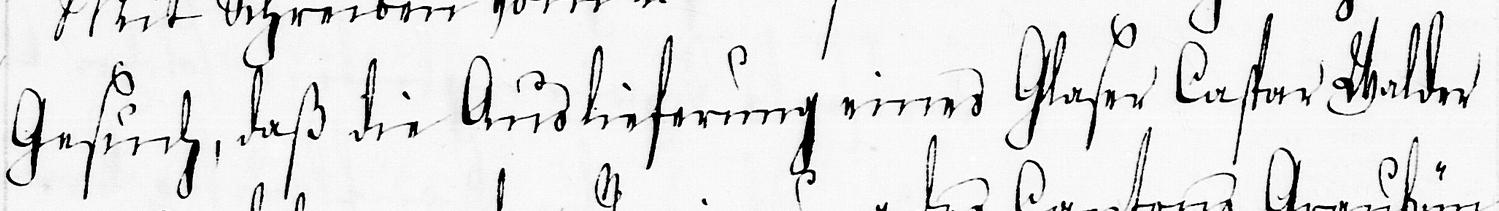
Gesuch, daß die Auslieferung eines Glaser Caspar Walder
